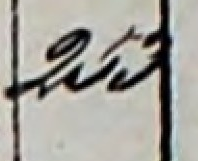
253
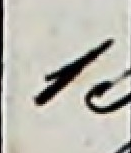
1
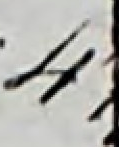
4
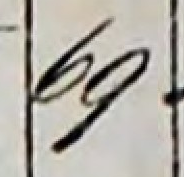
69
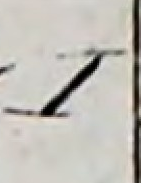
I
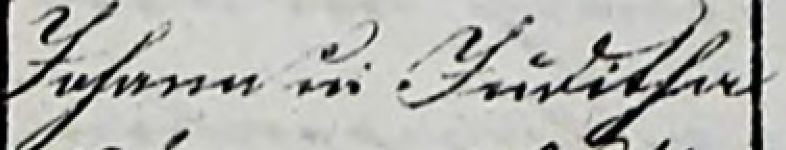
Johann u. Juditha
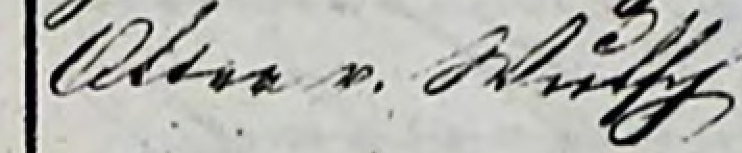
Otter v. Wutsch
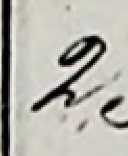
2
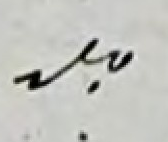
do
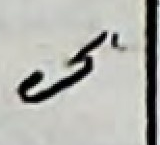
5
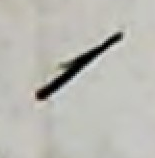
1
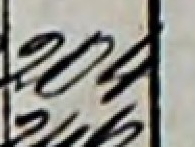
204
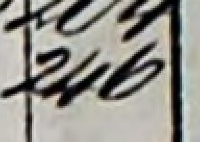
246
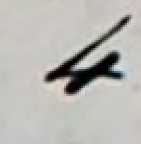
4
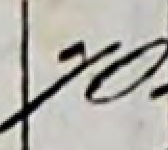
70
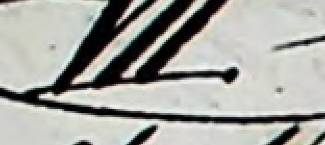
VII.
